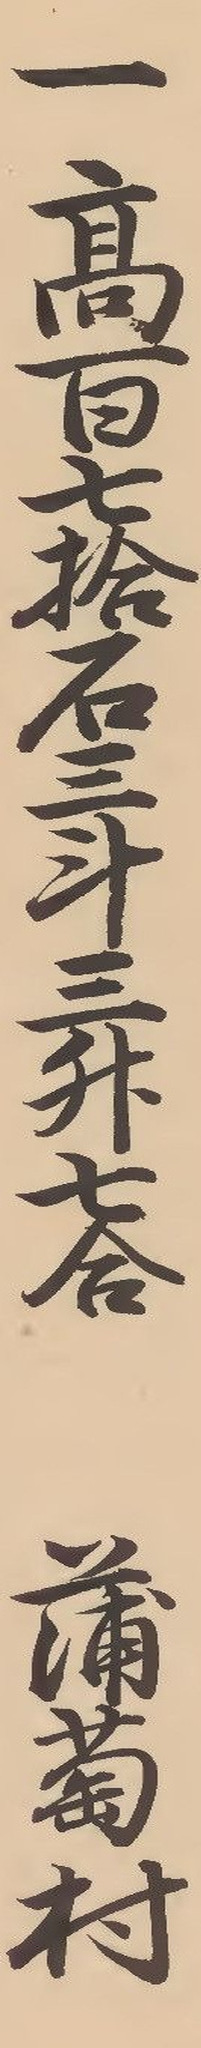一高百七拾石三斗三升七合葡萄村
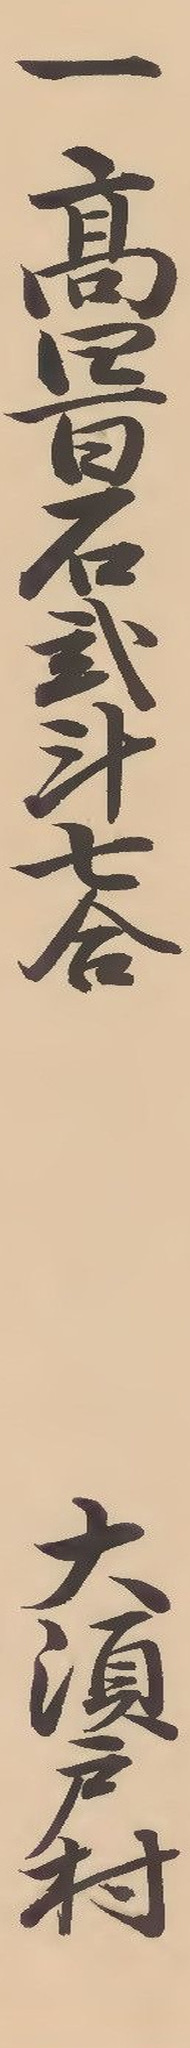一高四百石弐斗七合大須戸村
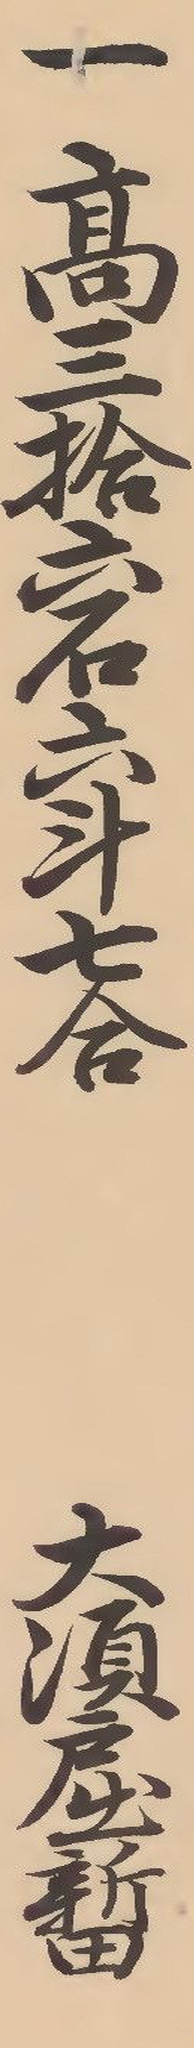一高三拾六石六斗七合大須戸出新田
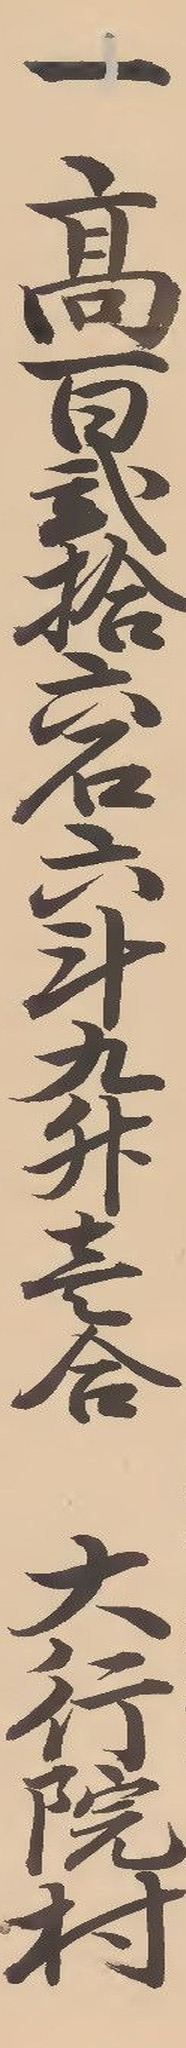一高百弐拾六石六斗九升壱合大行院村
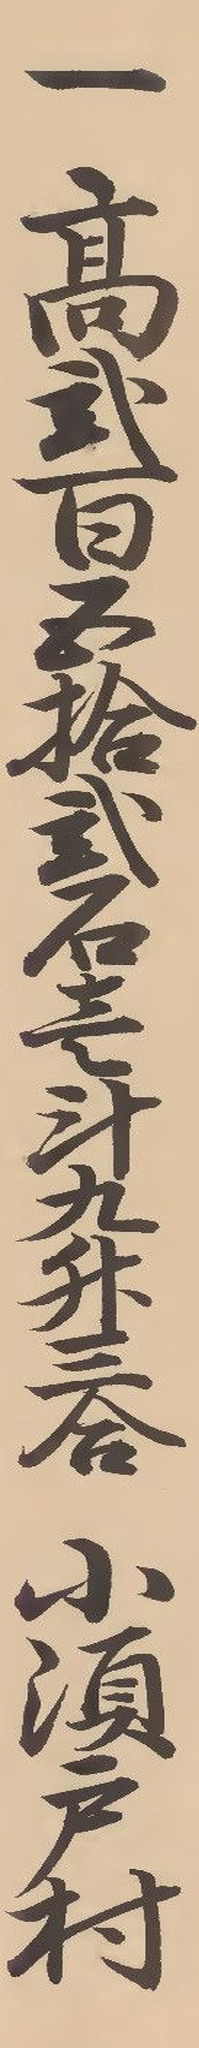一高弐百五拾弐石壱斗九升三合小須戸村
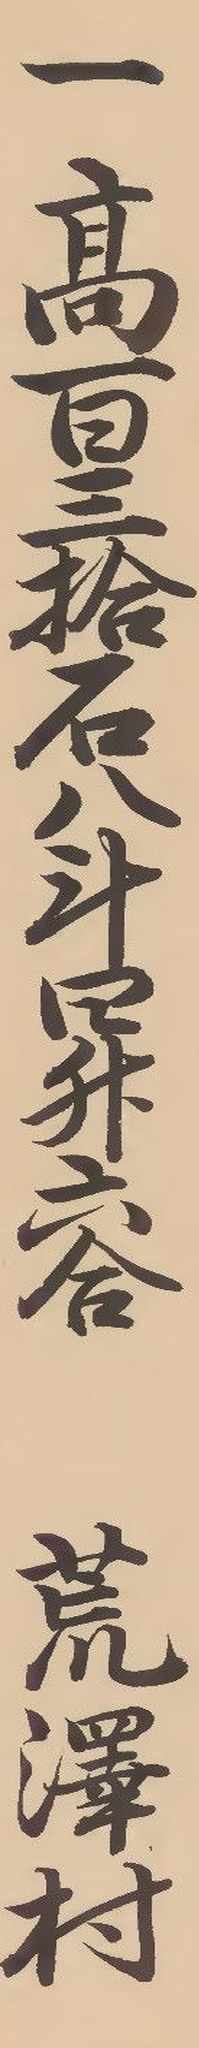一高百三拾石八斗四升六合荒沢村
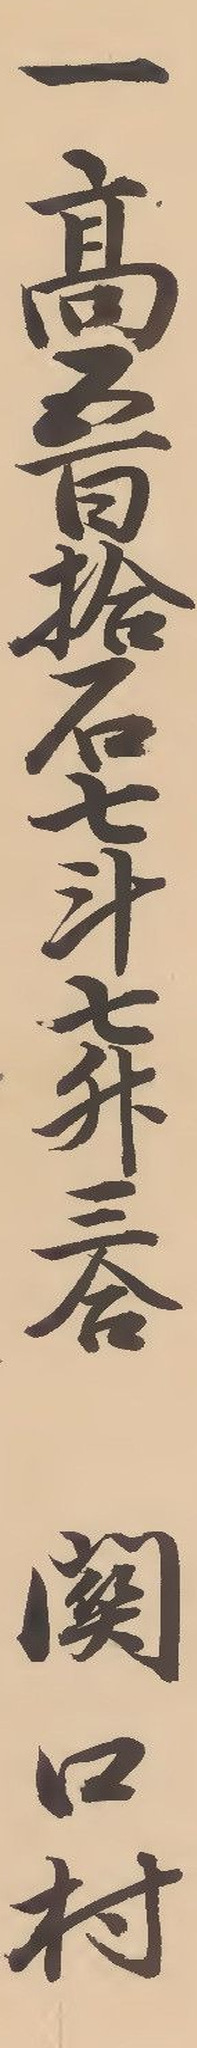一高五百拾石七斗七升三合関口村

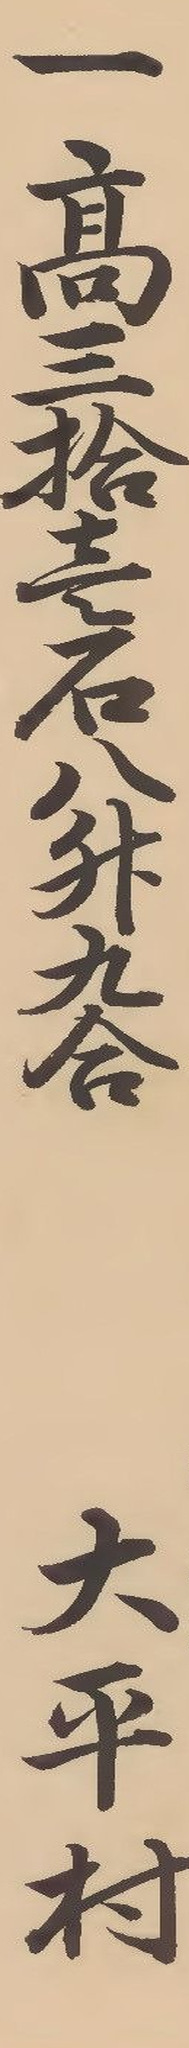一高三拾壱石八升九合大平村
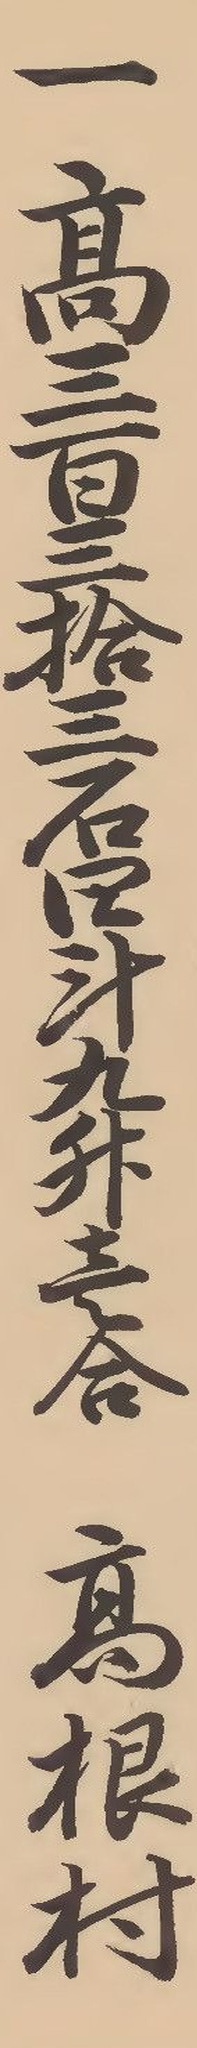一高三百三拾三石四斗九升壱合高根村
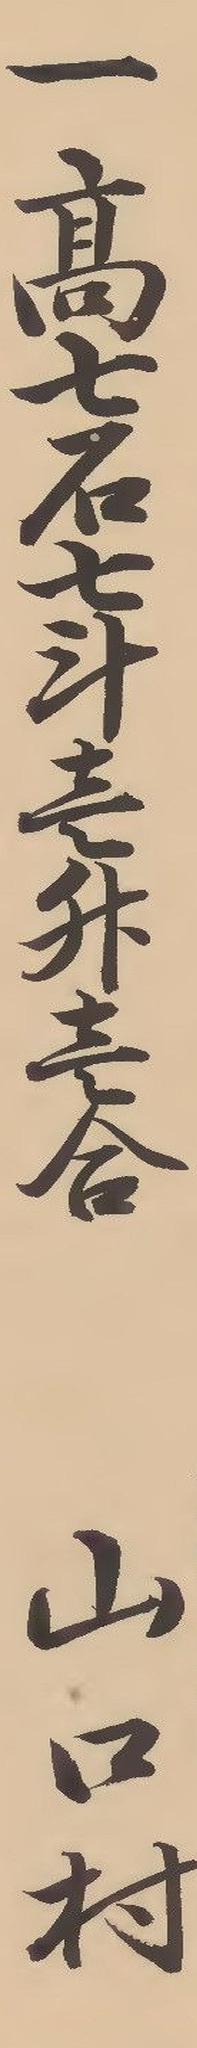一高七石七斗壱升壱合山口村
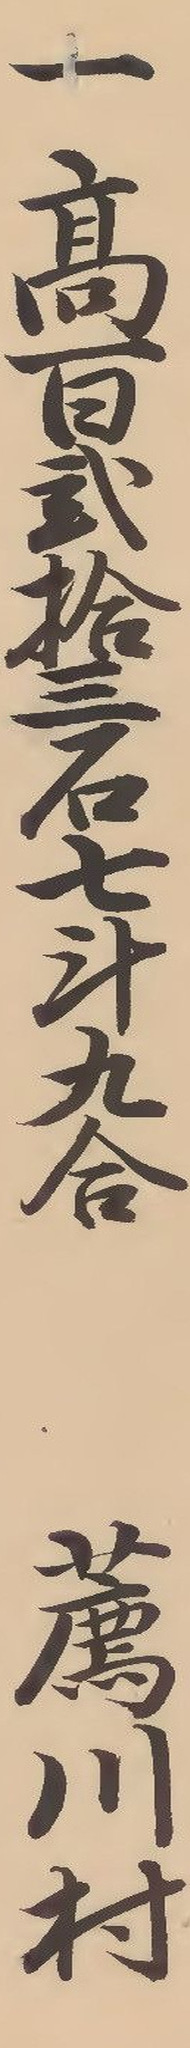一高百弐拾三石七斗九合薦川村
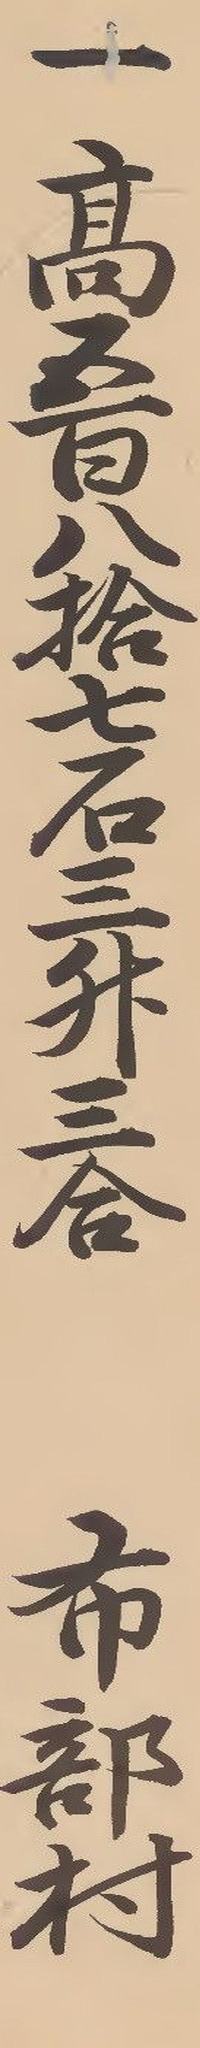一高五百八拾七石三升三合布部村
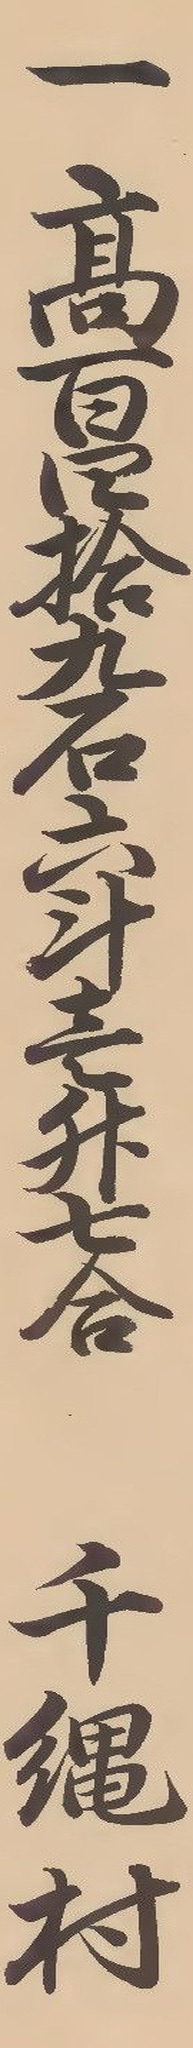一高百四拾九石六斗壱升七合千縄村
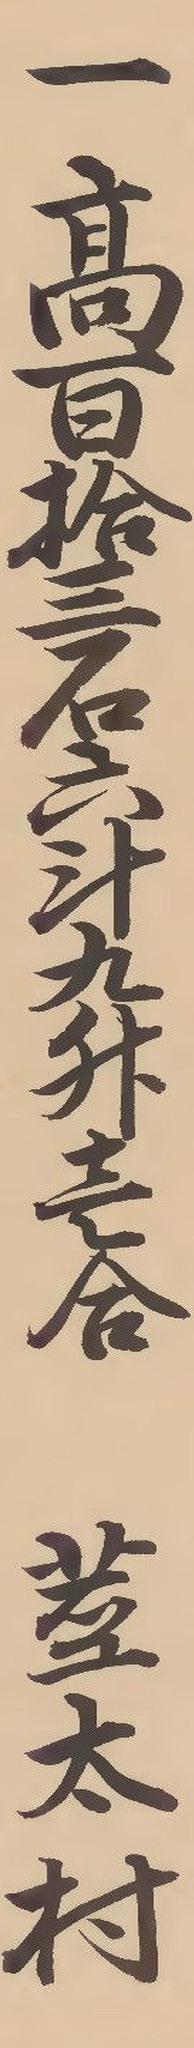一高百拾三石六斗九升壱合茎太村

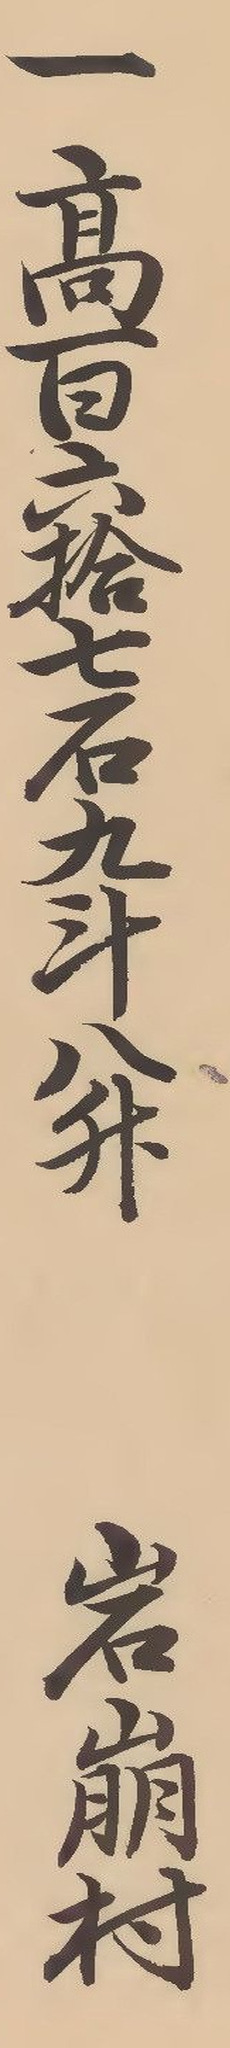一高百六拾七石九斗八升岩崩村
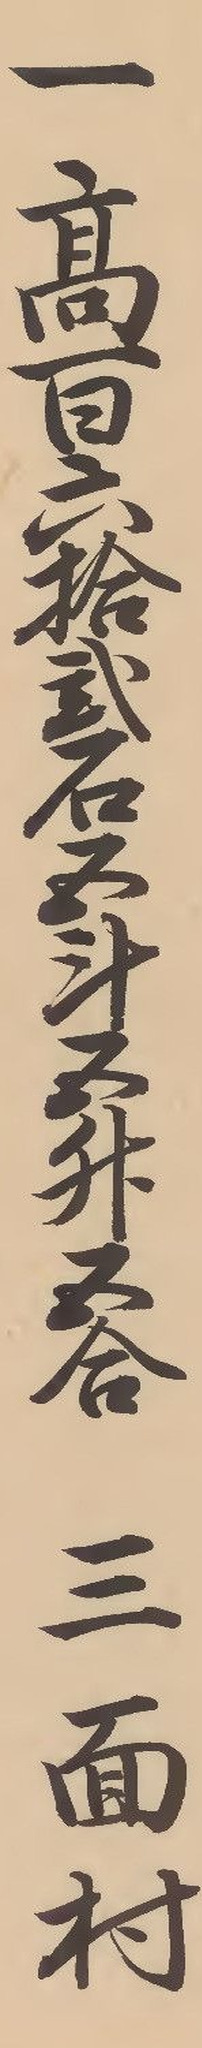一高百六拾弐石五斗五升五合三面村
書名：越後国郷帳　下
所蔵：国立公文書館 National Archives of Japan
